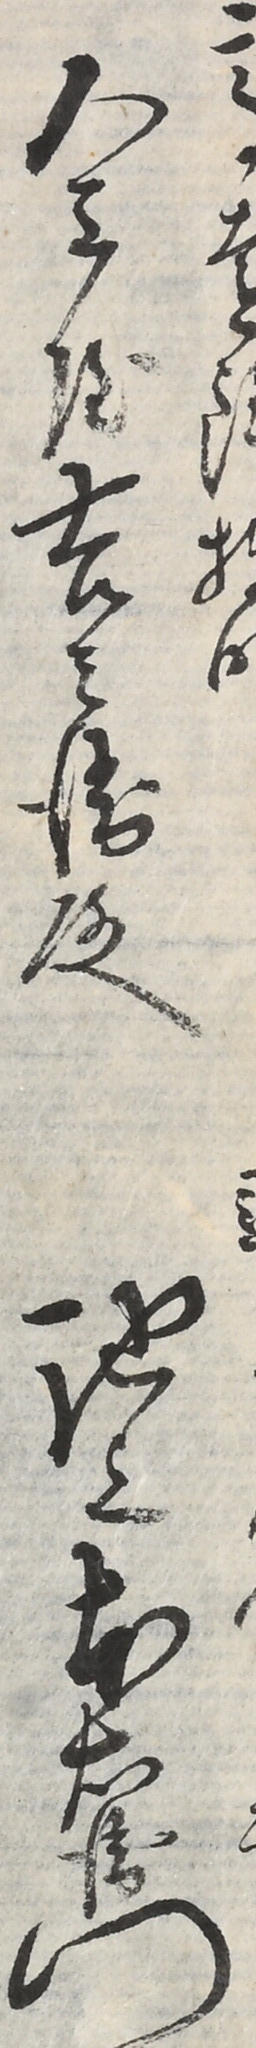金屋吉兵衛殿池上本右衛門
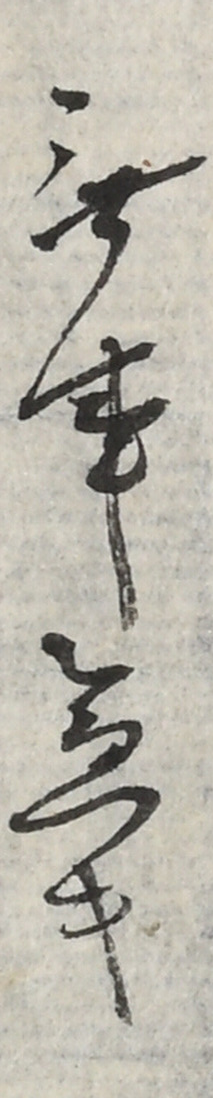無事急キ
